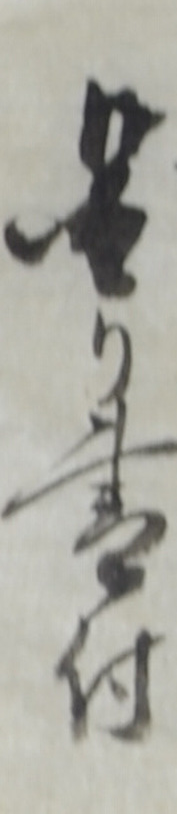図り書付
